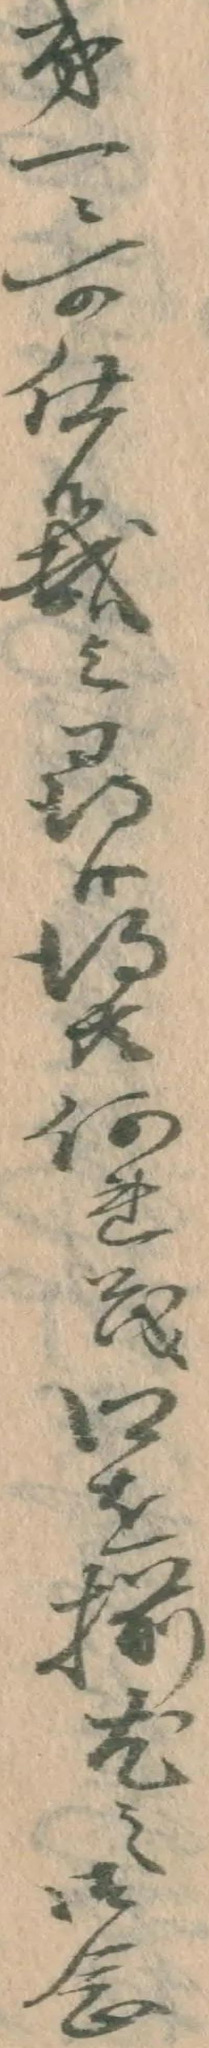第一に可仕候哉与尋候得共何連茂口を揃尤之御念
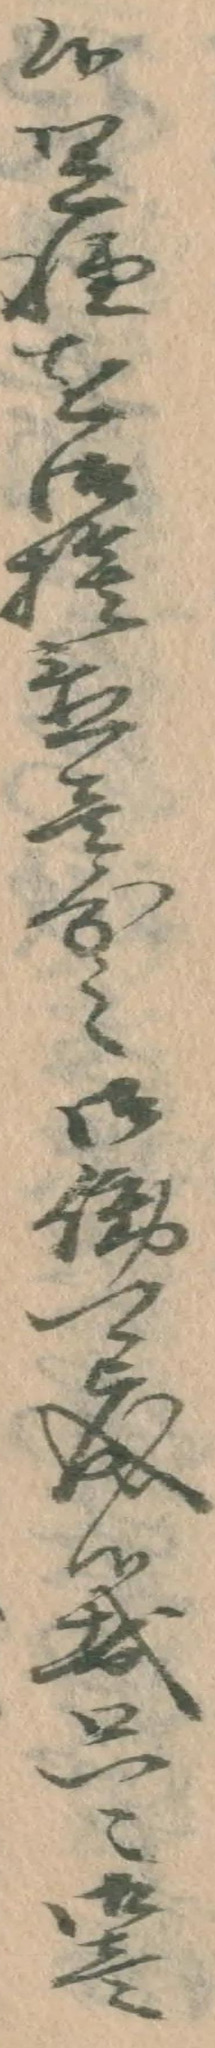候足軽を御捨置壱分之御働可被成候哉只々御壱
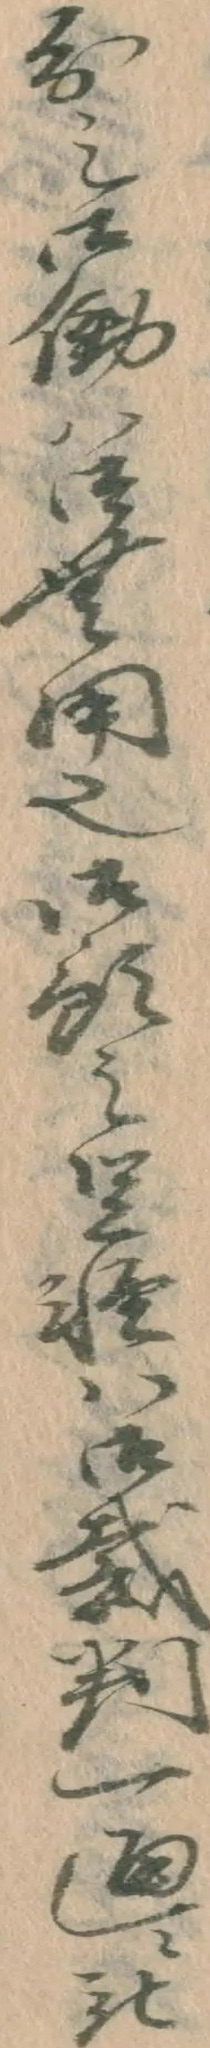分之御働は御無用也御預之足軽は御裁判一通に被
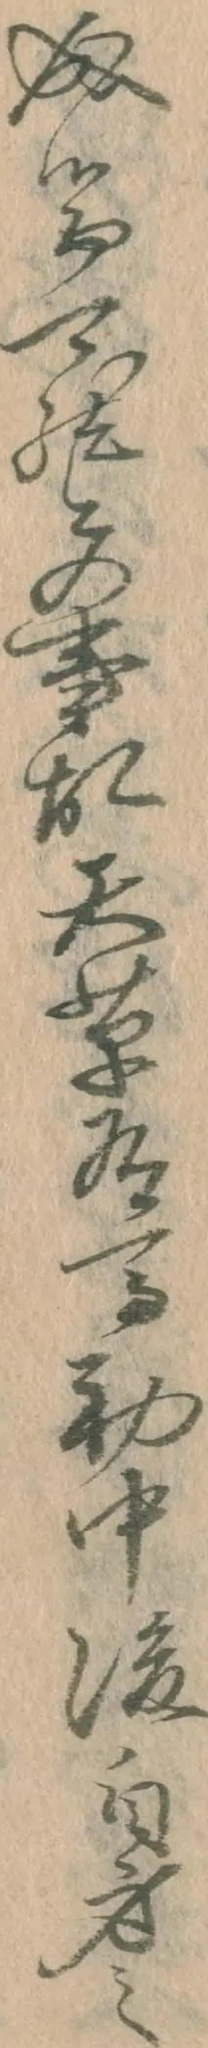成候而可然との事故天草有馬勤中後自身之
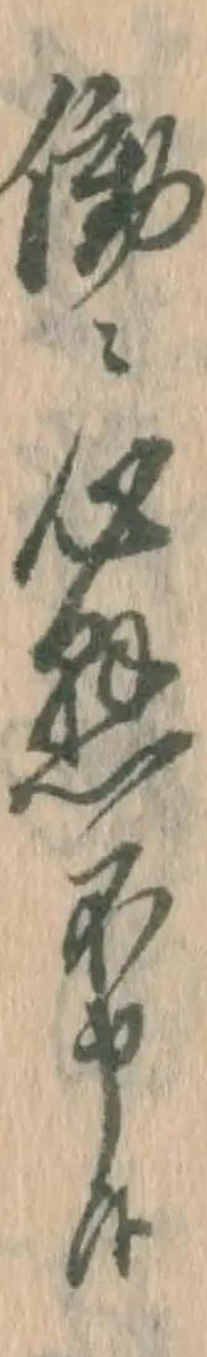働に心懸不申候
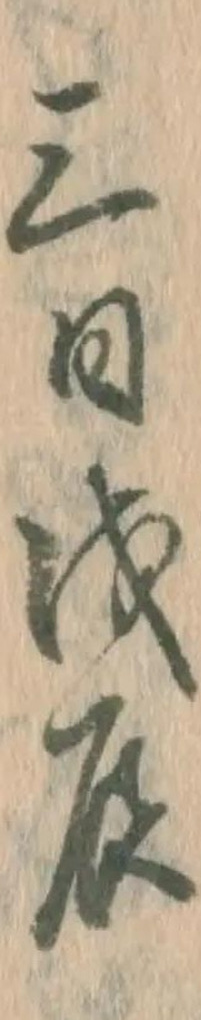三日戌辰
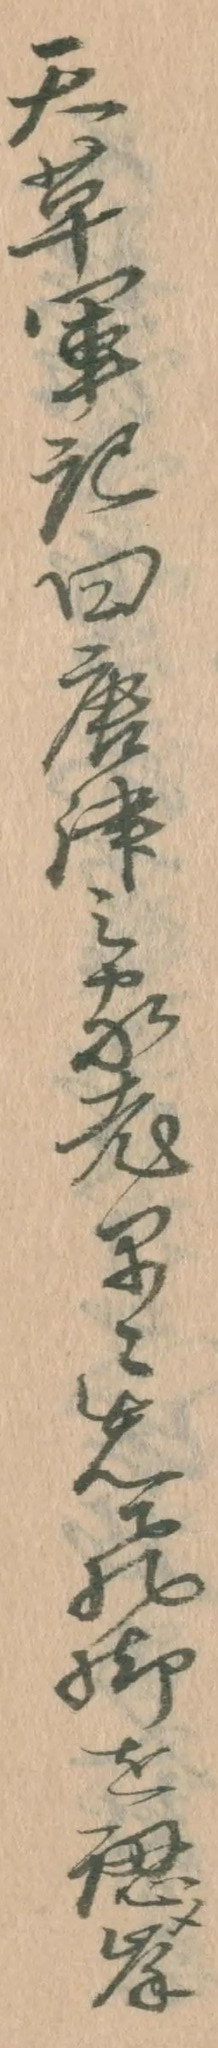天草軍記曰唐津之家老早々先飛脚を認め岸
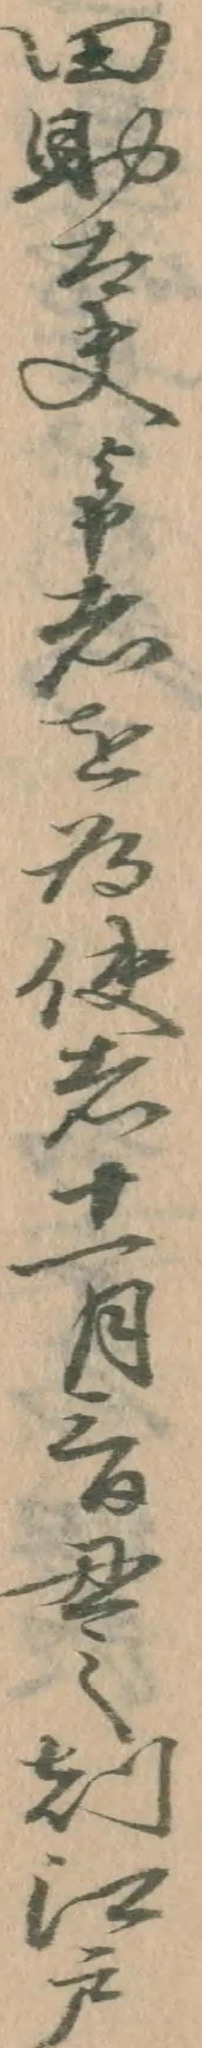田助太夫与申者を為使者十一月三日丑之刻江戸
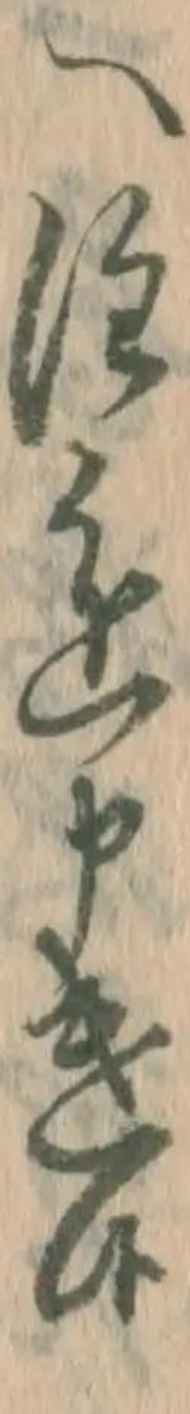へ注進申遣候
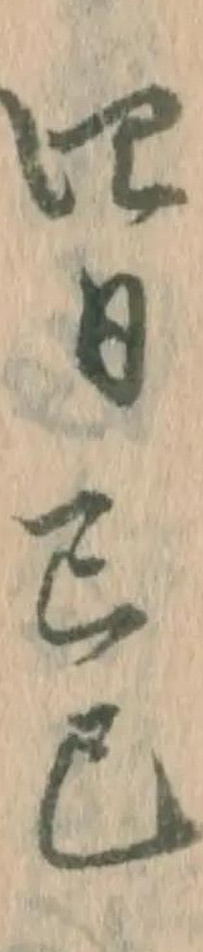四日己巳
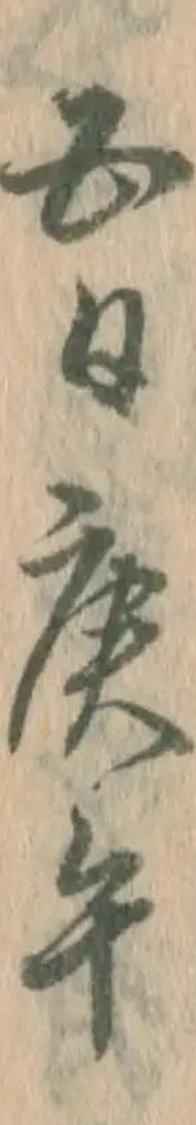五日庚午
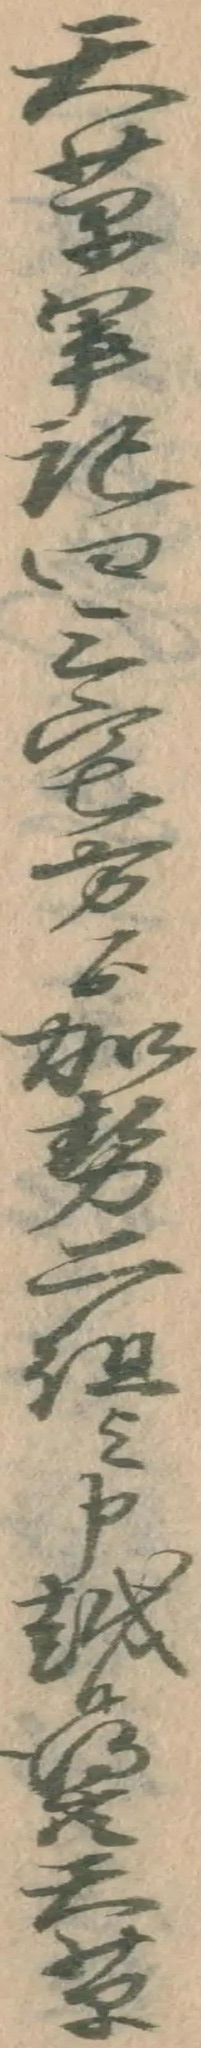天草軍記曰三宅方ゟ加勢二組与申越候得共天草
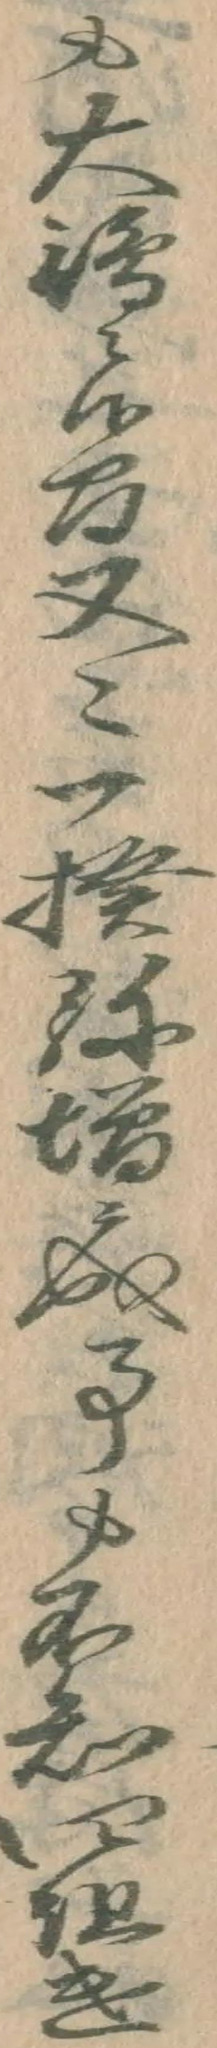も大島に候間又々一揆弥増に成事も不知四組遣
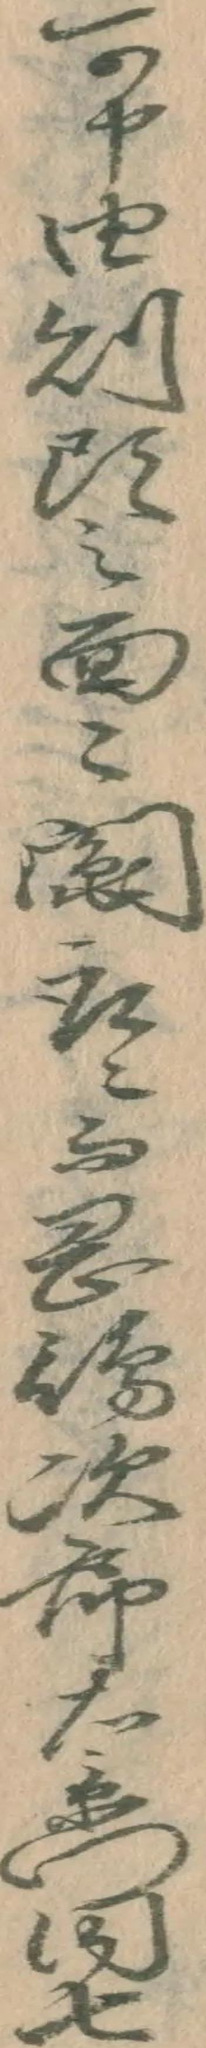可申由則頭之面々聞取に而岡島次郎右衛門同七
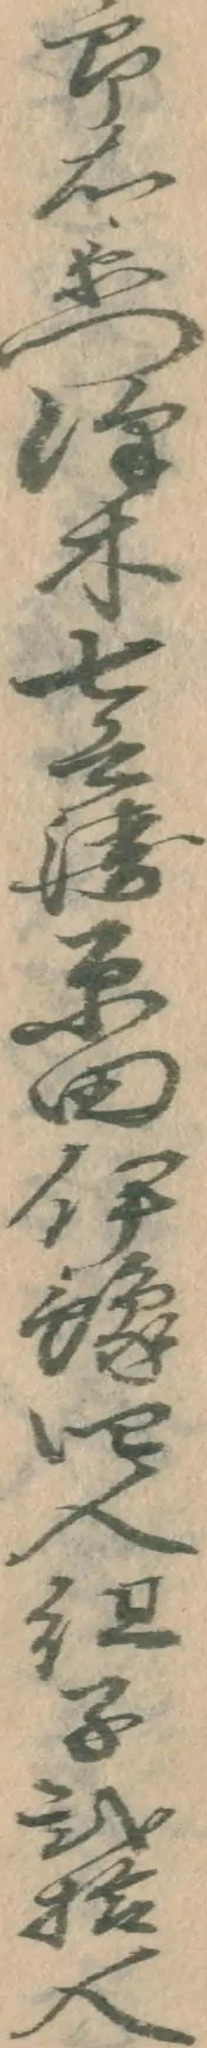郎右衛門沢木七兵衛原田伊予四人組子弐拾人
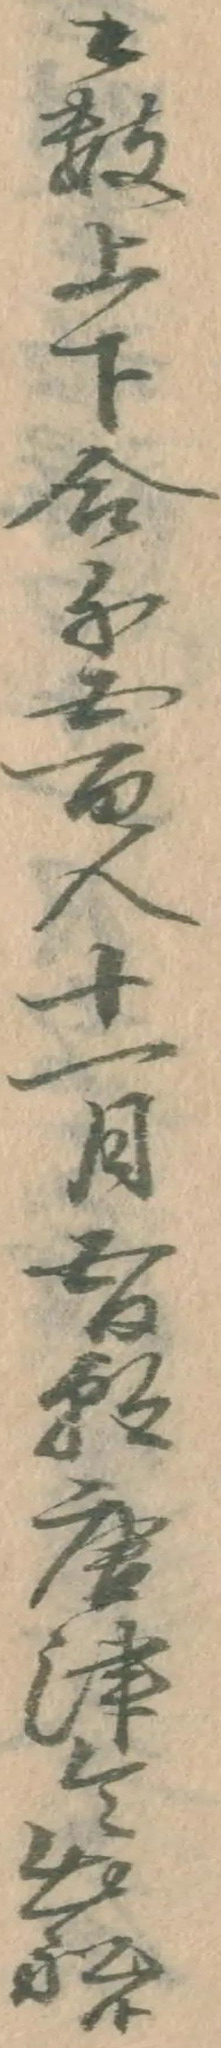之数上下合千五百人十一月五日朝唐津令出舩候
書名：切支丹御退治記 49巻. [2]
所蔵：国立国会図書館 National Diet Library, JAPAN
